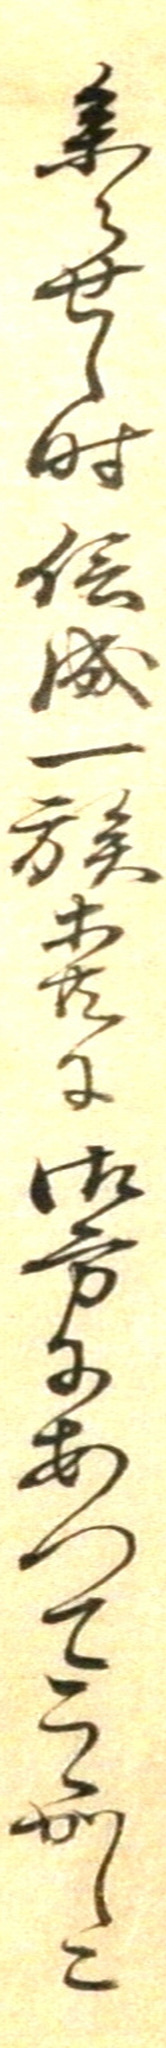参らせし時信成一族等共に御方にあつてこゝかしこ
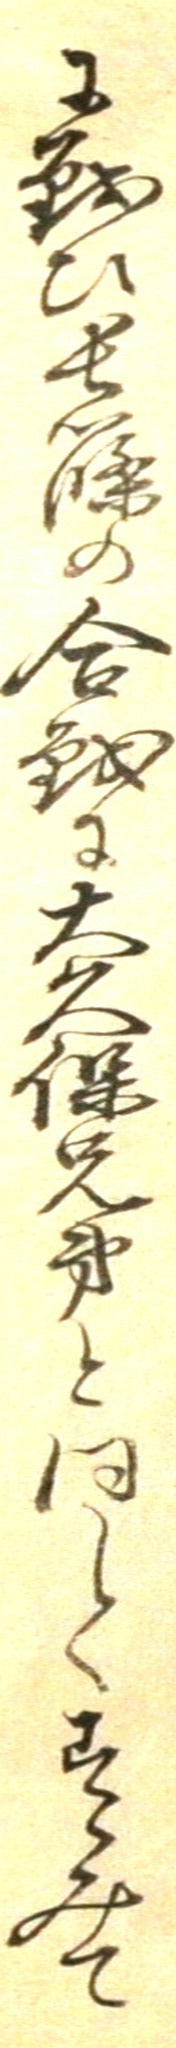に戦ひ長篠の合戦に大久保兄弟と同しくすゝみて
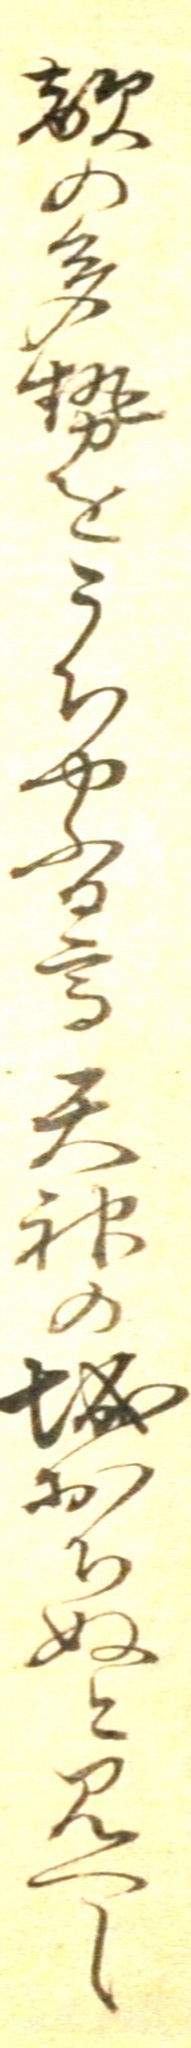敵の多勢をうちやふる高天神の城おちぬと見へし
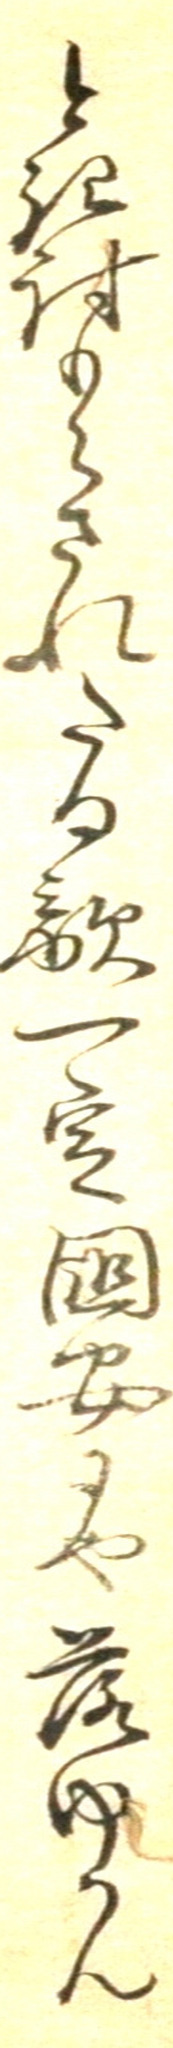とき討もらされたる敵一定国安にや落ゆかん
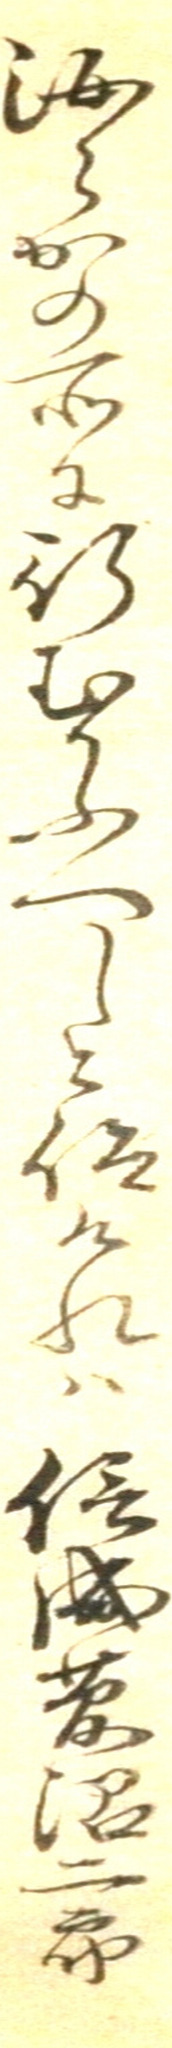汝らかの所に行むかふへしと仰けれは信成菅沼二郎
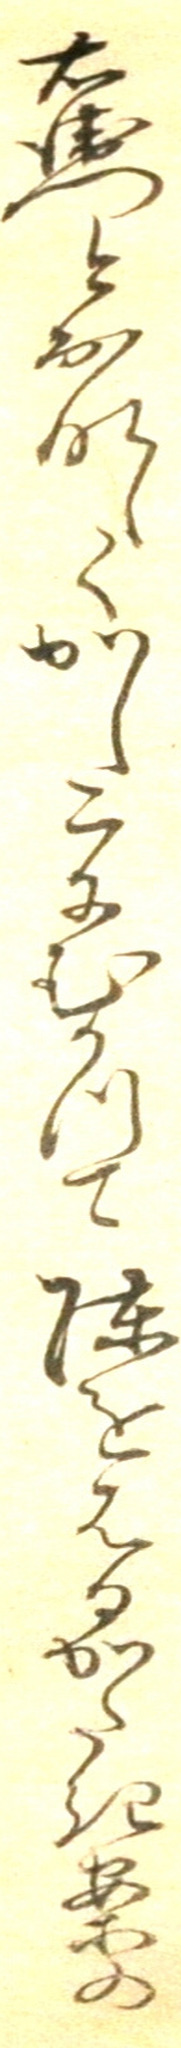右衛門とおなしくかしこにむかつて陣をはるかたき案の
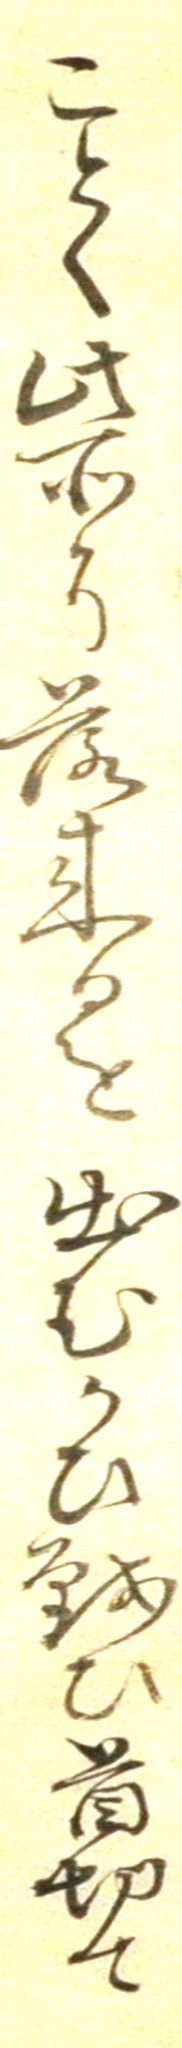ことく此所に落来るを出むかひ戦ひ首切て
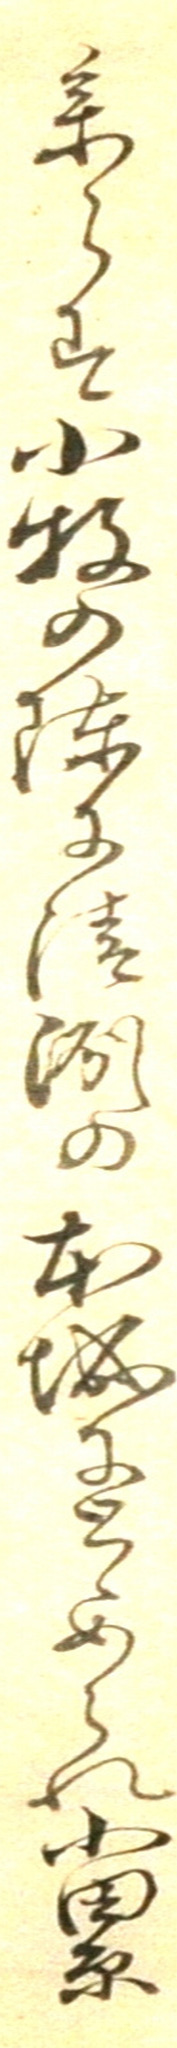参らす小牧の陣に清洲の本城にとゝめられ小田原
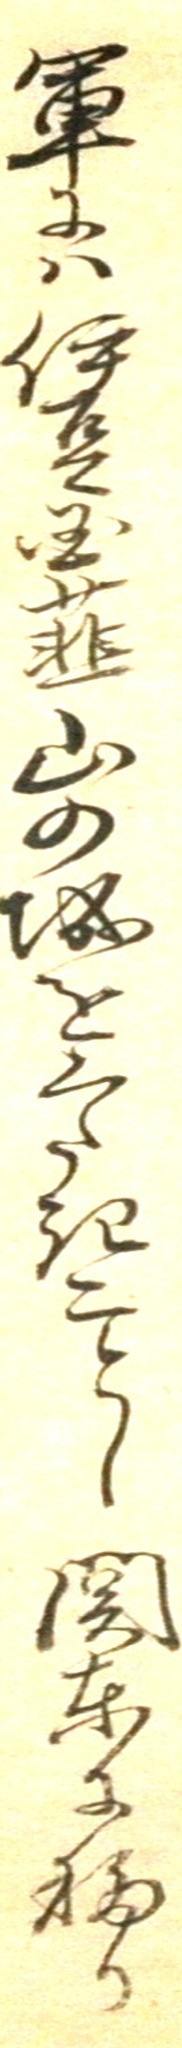軍には伊豆国韮山の城をくたきことし関東に移り
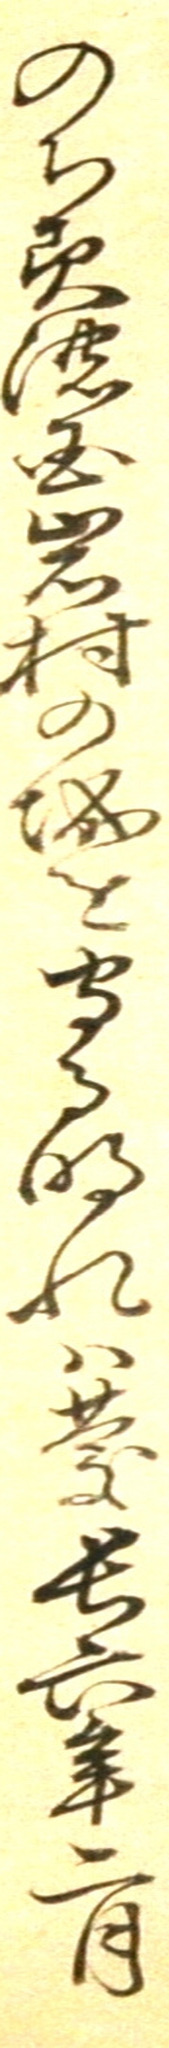のち美濃国岩村の城を守る明れは慶長六年二月
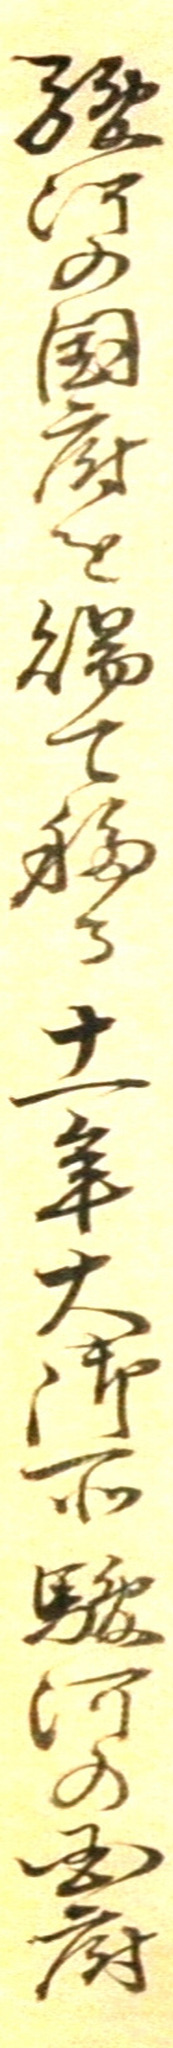駿河の国府を賜て移る十一年大御所駿河の国府

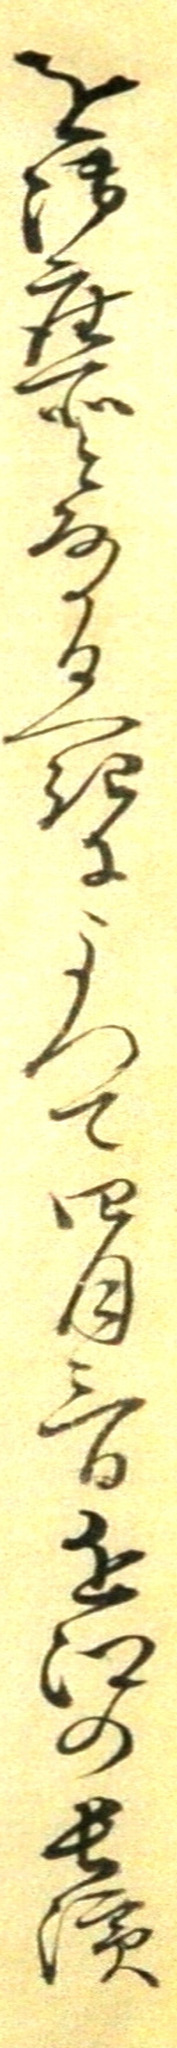を御座所となるへきによつて四月三日近江の長浜
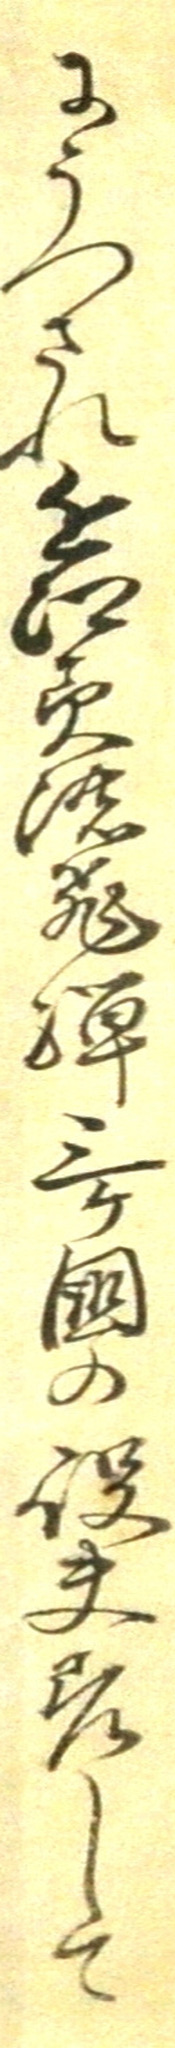にうつされ近江美濃飛騨三ヶ国の役夫差して
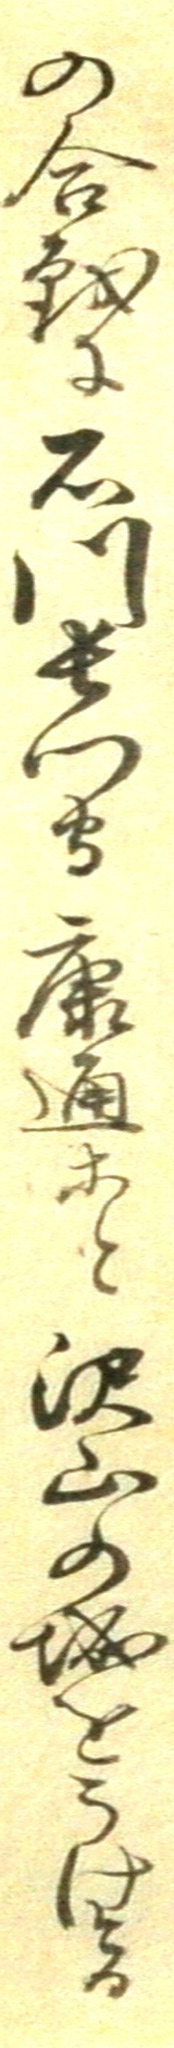の合戦に石川長門守康通等と沢山の城をうけとる
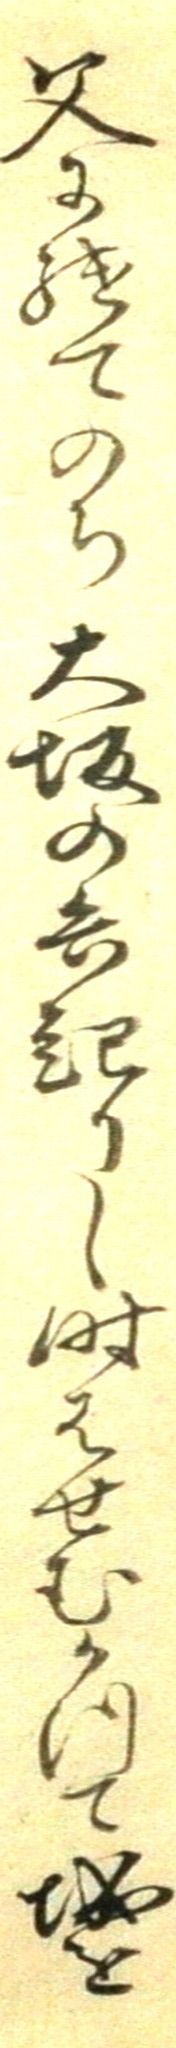父に継てのち大坂の兵起りし時はせむかつて城を
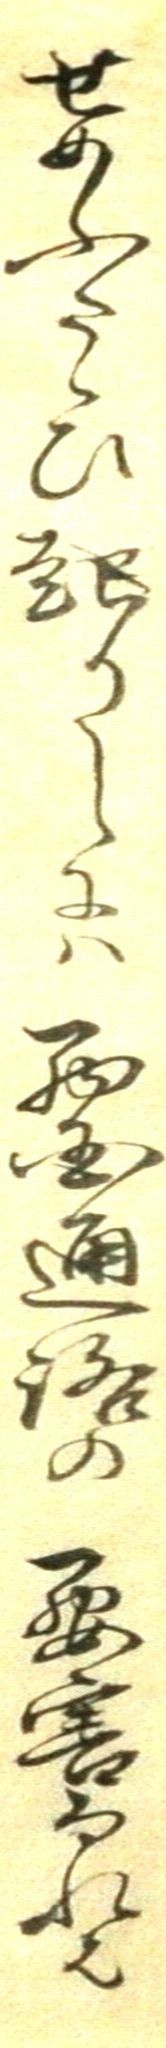せめふたゝひ起りしには西国通路の要害なれは
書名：藩翰譜（四・中）
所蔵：伊那市立高遠町図書館・合同会社AMANE
